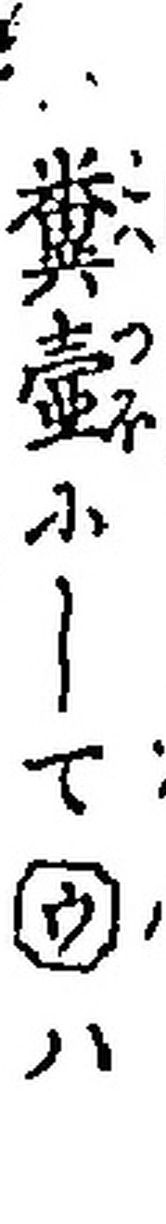糞壺にしてウは
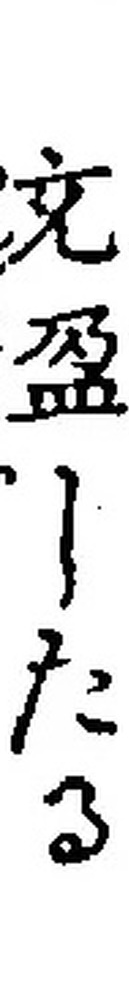充盈したる
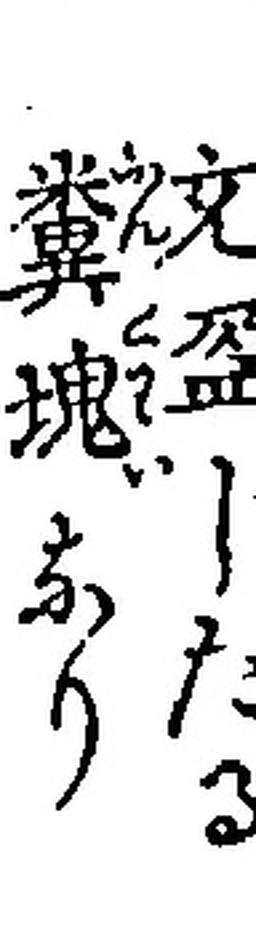糞塊なり
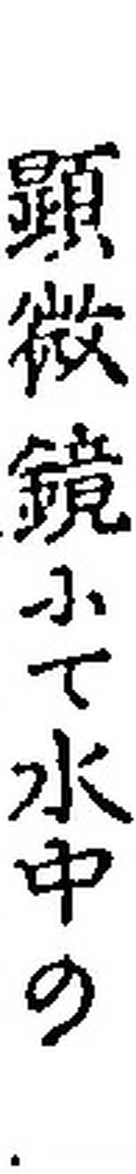顕微鏡にて水中の
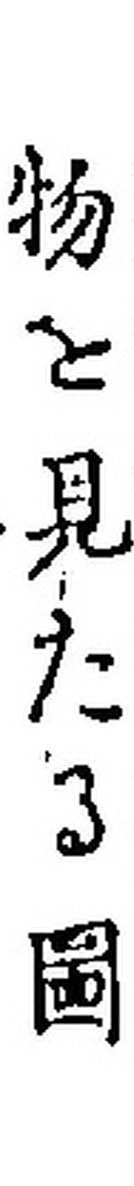物を見たる圖
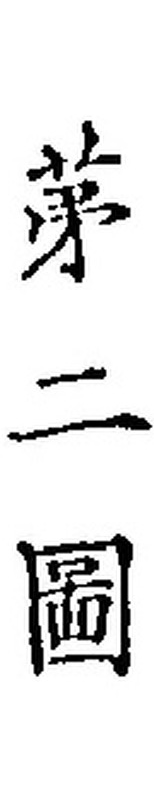第二圖
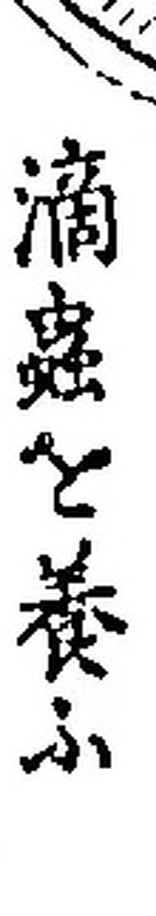滴蟲を養ふ
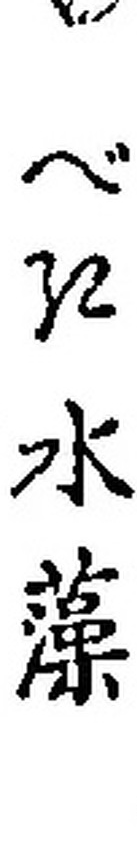べに水藻
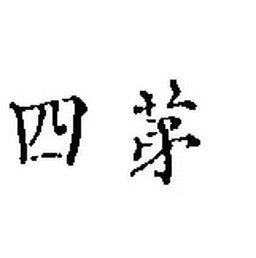第四圖
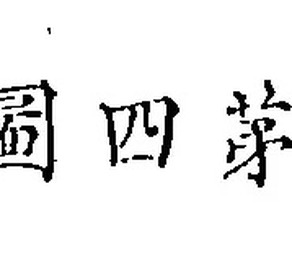第四圖
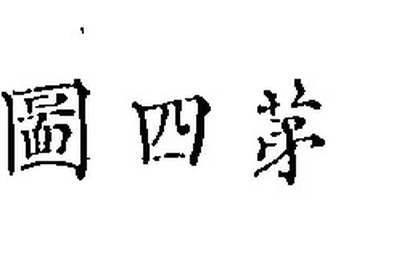第四圖
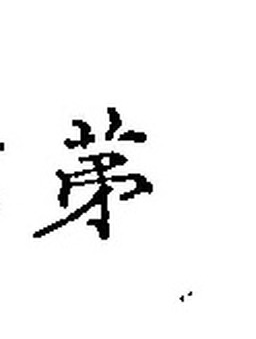第一圖
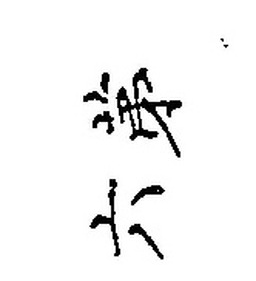第六圖
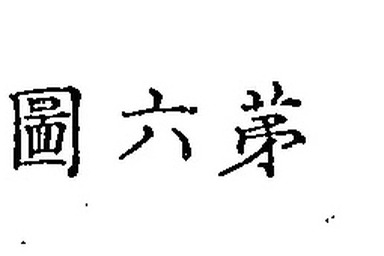第六圖
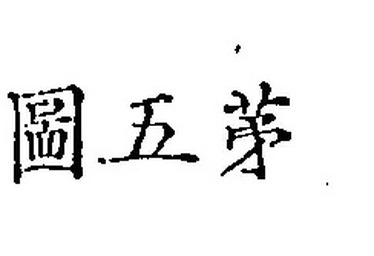第五圖
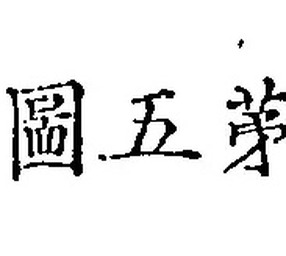第五圖
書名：飲水の心得 : 伝染病の予防
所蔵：国立国会図書館 National Diet Library, JAPAN
